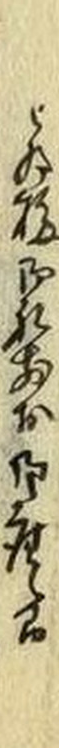被為移御礼前於御座之間
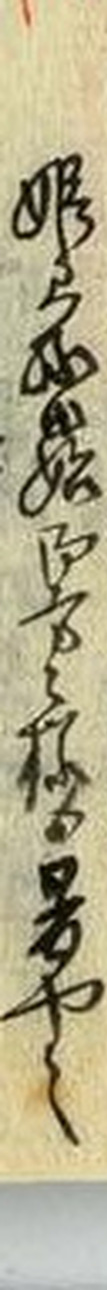姫君様御始御方々様ゟ暑中之
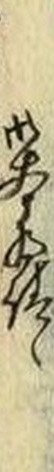御使被為請候
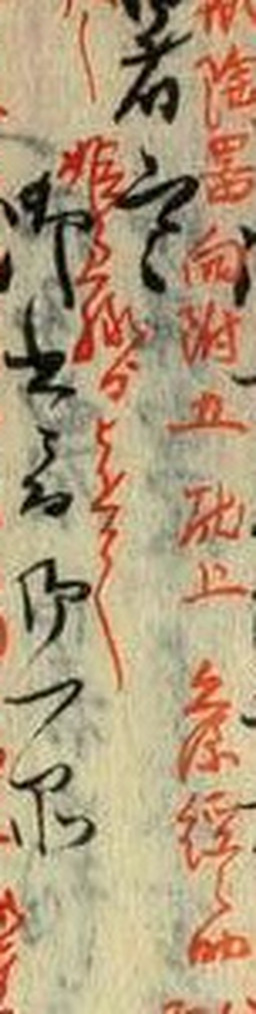御書ニ而御一品
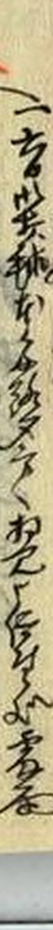一六日御打毬本多路夕方へ拝見被仰付候処雷雨
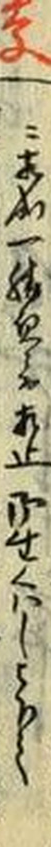ニ相成一勝負ニ而相止御生くハし被下之
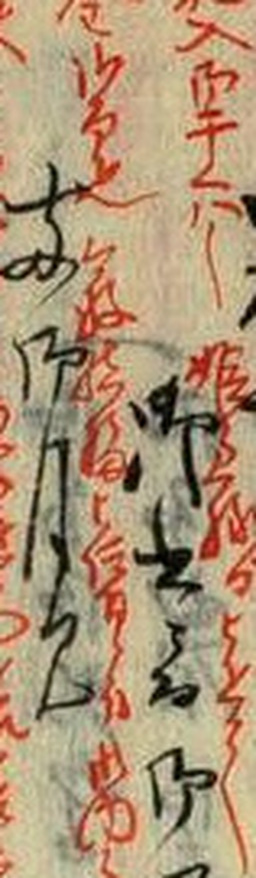両御月見
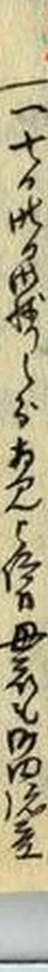一七日昨日御残り之分拝見被仰付母衣も町田弥藤
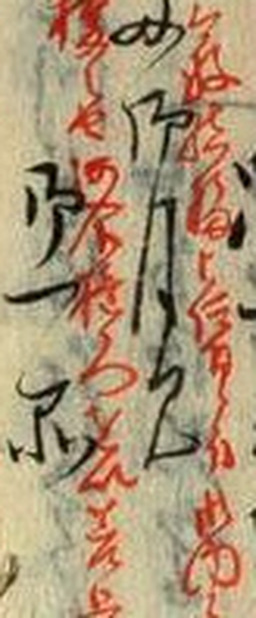御一品
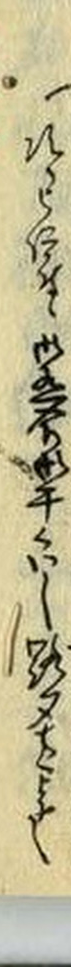次へ被仰付御有合御干くハし路夕方へ被下之
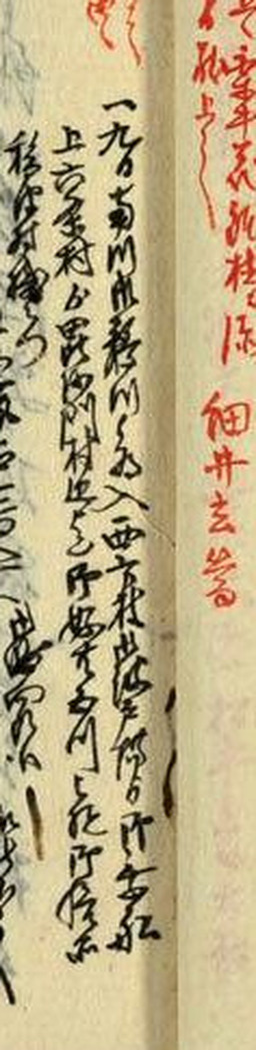一九日南川御鵜川被為入西方村御波戸場ゟ御乗船
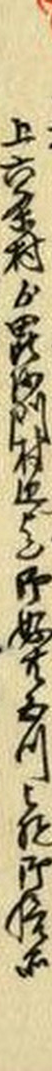上六条村ゟ毘沙門村辺迄御好共五川被遊御膳所
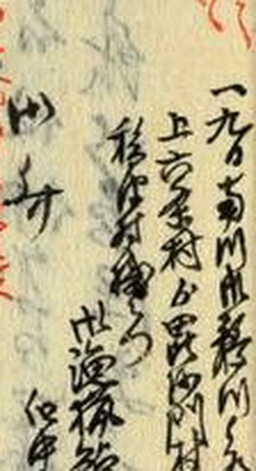稲津村織右衛門
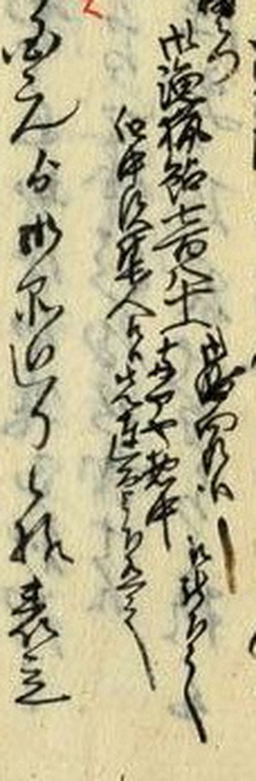但中沢隼人江ハ先達而被下有之
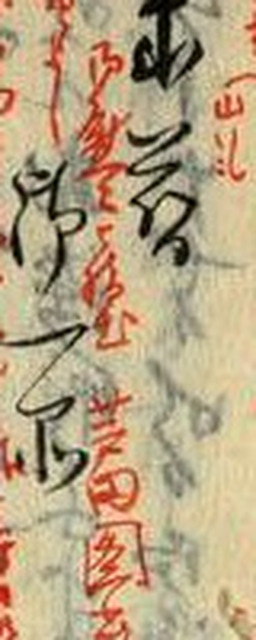御一品
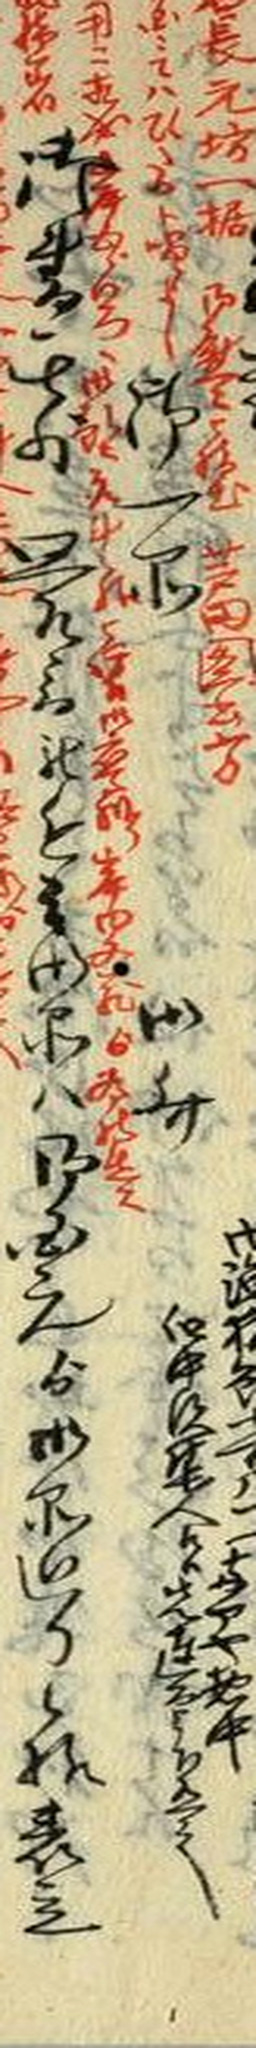御書其外思召ニ而被進之其御品ハ御国元ゟ御品廻り候様表立
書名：少傅日録抄（斉承付側向頭取日記、在国）
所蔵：福井県文書館 Fukui Prefectural Archives
